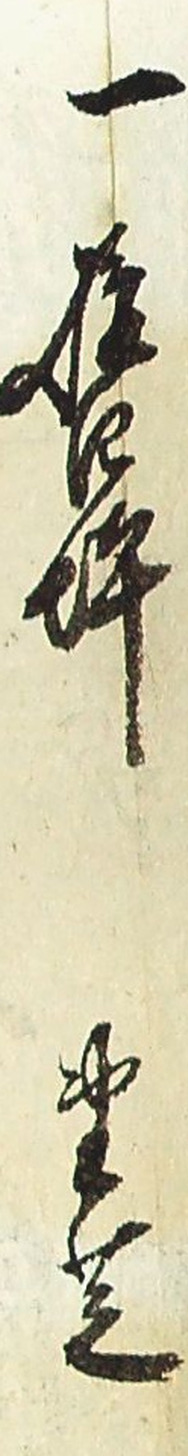一拾四坪野芝
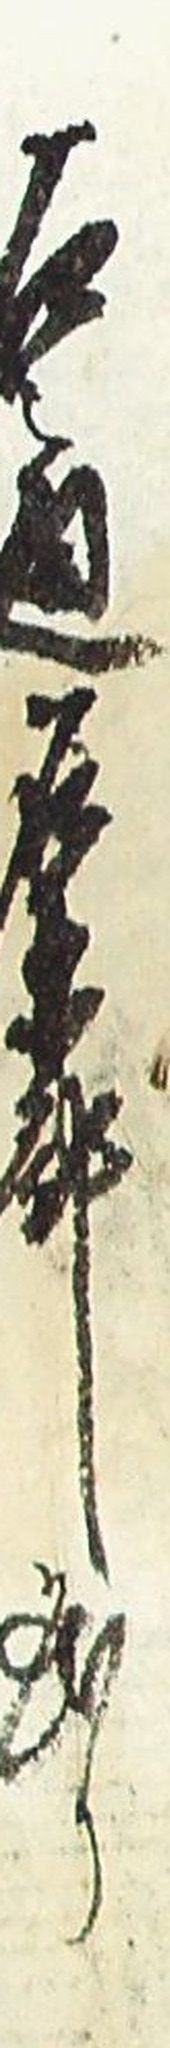右之通名東郡当り

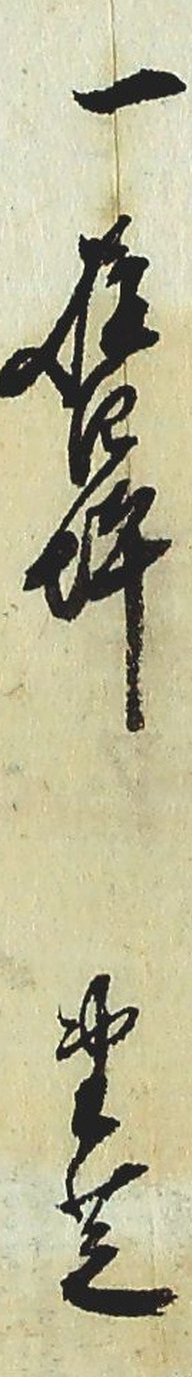一拾四坪野芝
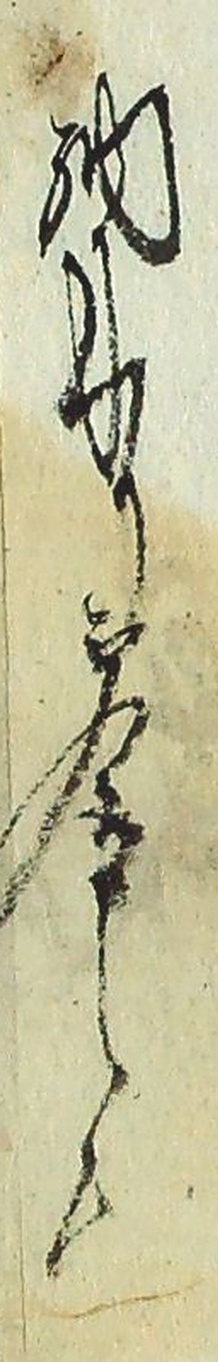納来り受取申候以上
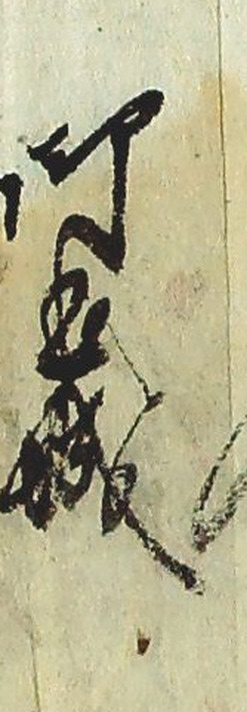御本城
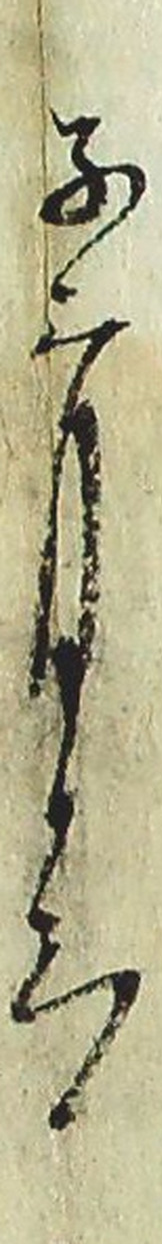子三月十三日
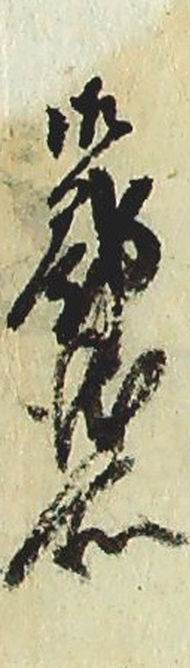御郡代所

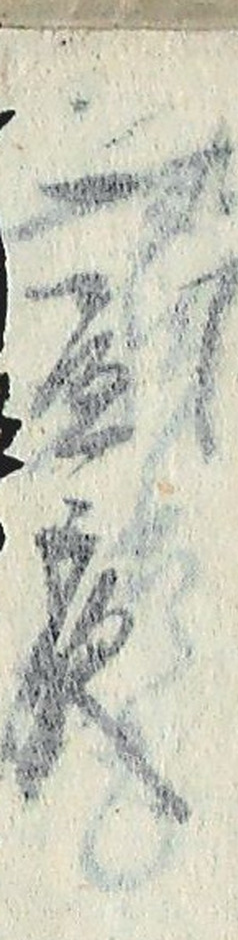一昼夜
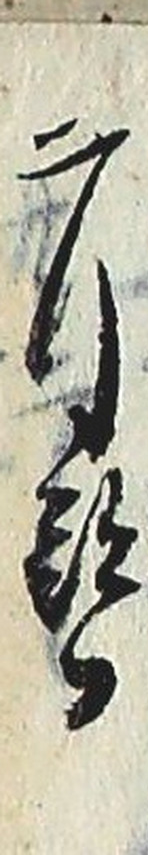二月朔日
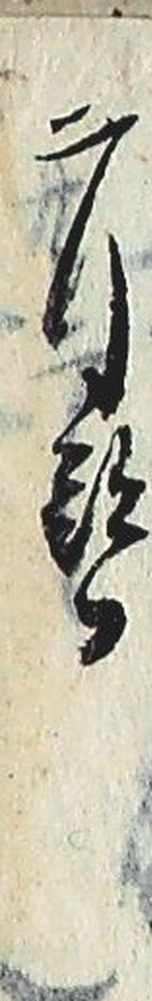二月朔日
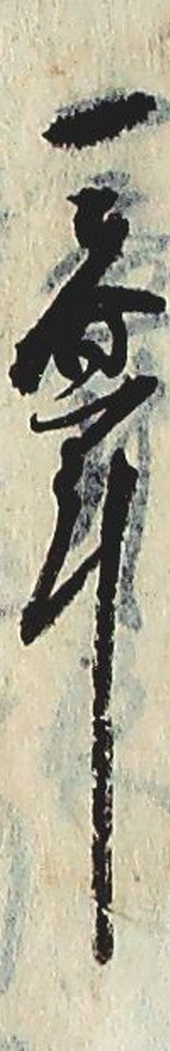一昼夜
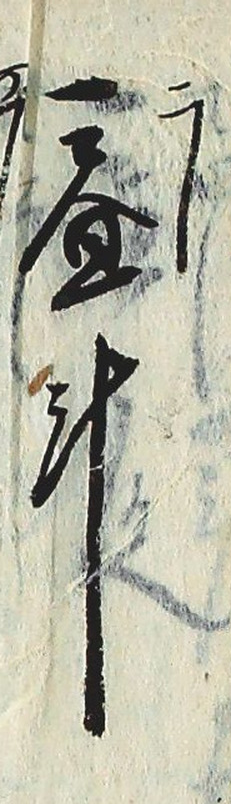一昼計
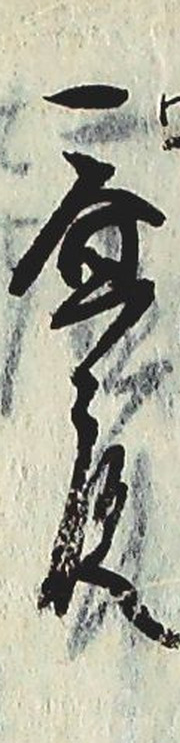一昼夜
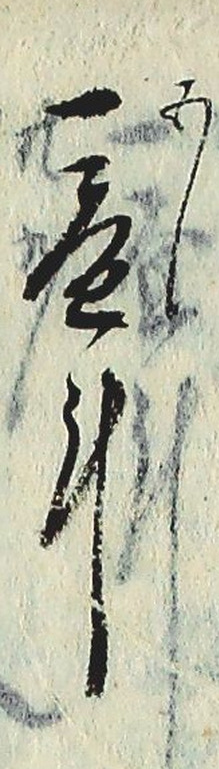一昼計
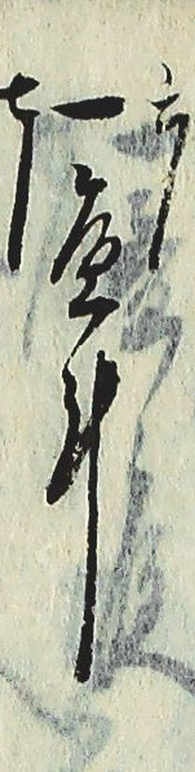一昼計
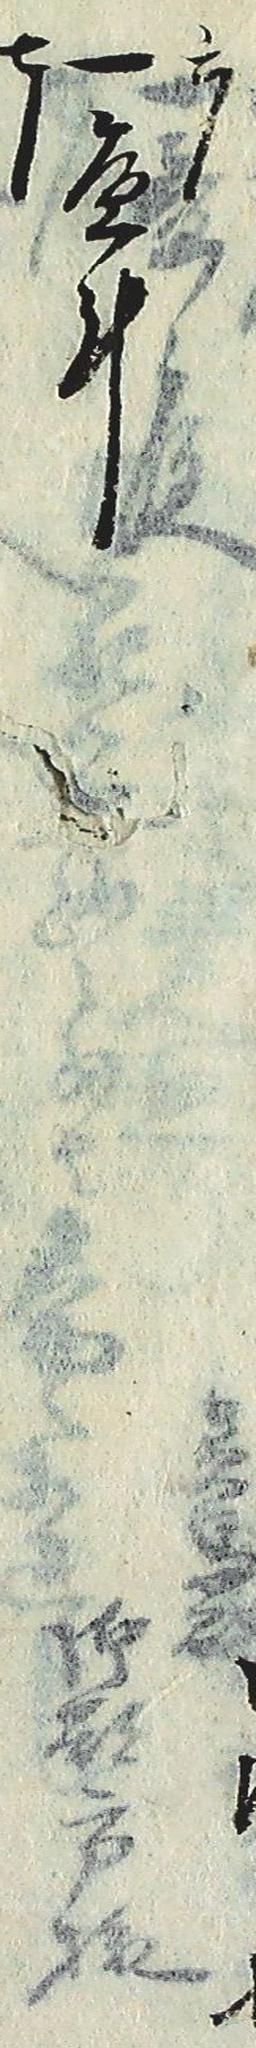一昼計
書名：名東郡中諸割賦元帳
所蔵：鳴門教育大学 Naruto University of Education
